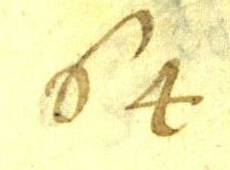64
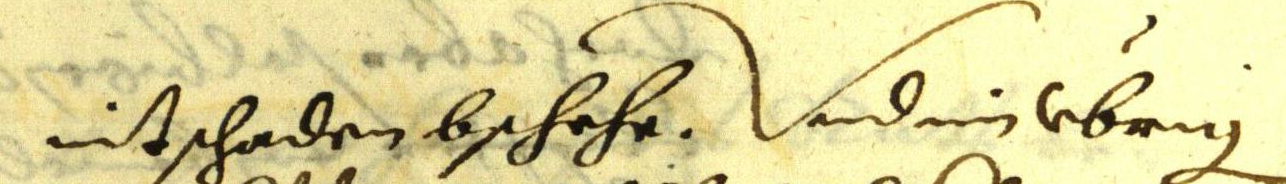nit schaden bschehe. Vnd im v̄brig
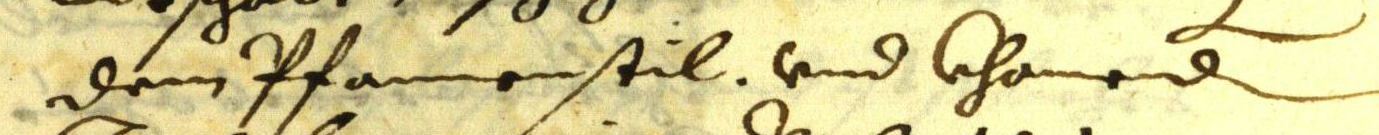dem Pfannenstil. vnd khomend
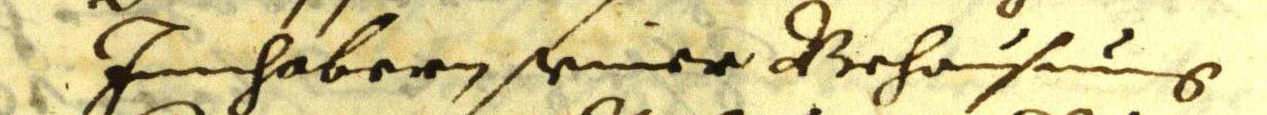Innhabern seiner Behaūsūng
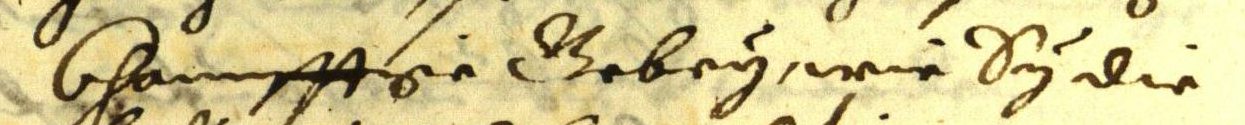Khonnfftige Gebeȳ, wie Sȳ die
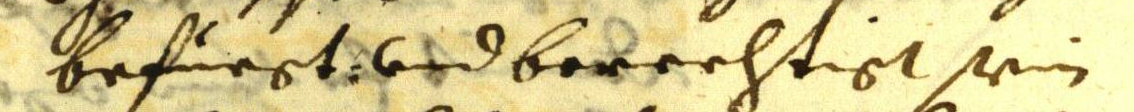befūegt: vnd berechtigt sein
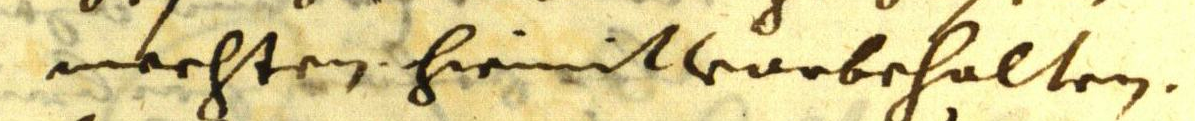mochten. hiemit vorbehalten.
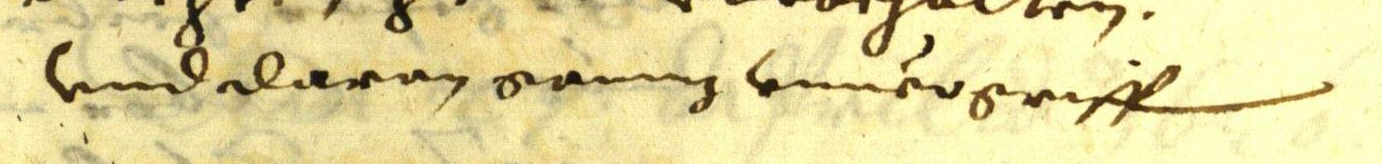vnd daran gannz vnvērgriff.
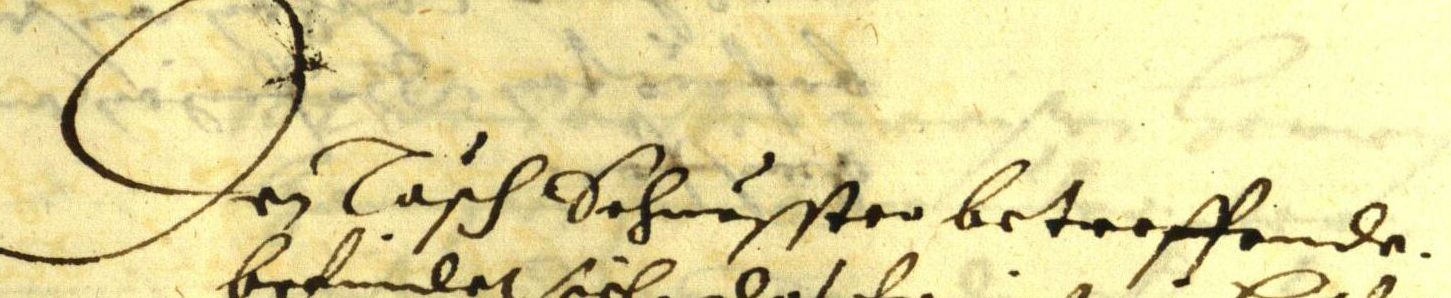Den Tāsch Schūesster betreffende.
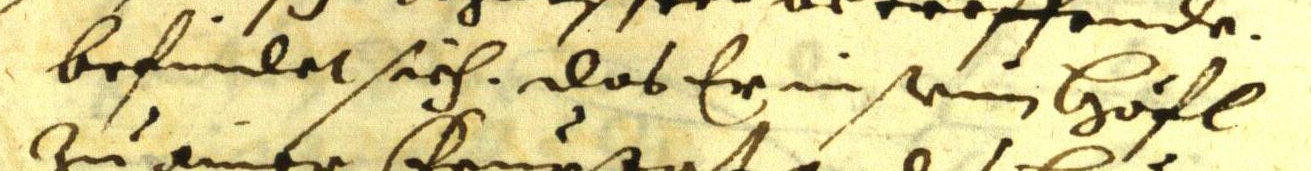befindet sich. das Er in seinen Hōfl
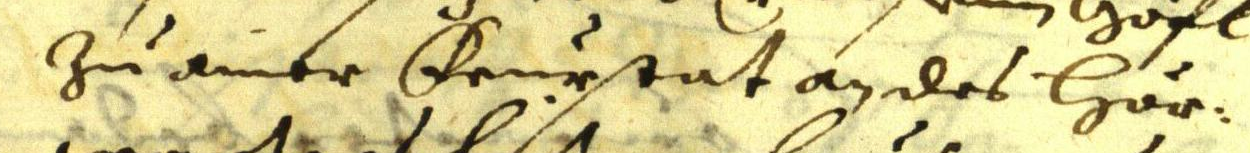Zū ainer Feūrstat an des Hōr¬
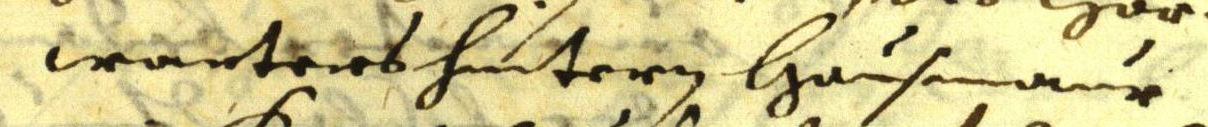warters hintern Haūsmaūr
